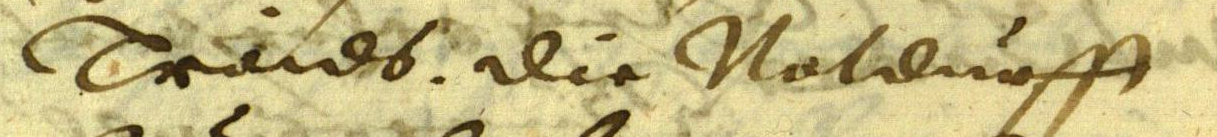Traids. die Notdūrfft
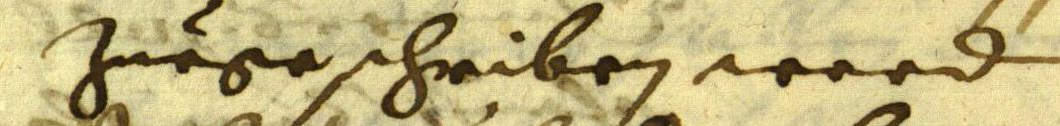Zūegeschriben werd
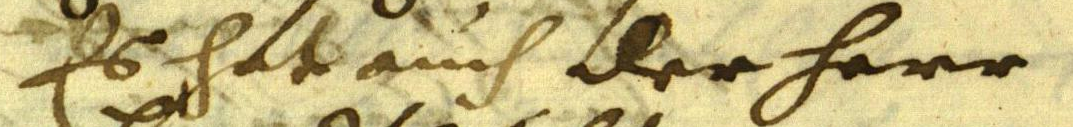Es hat aūch der herr
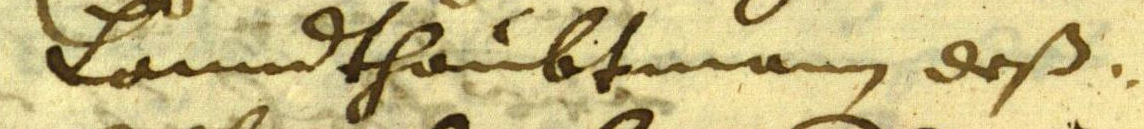Lanndthaūbtmann deß¬
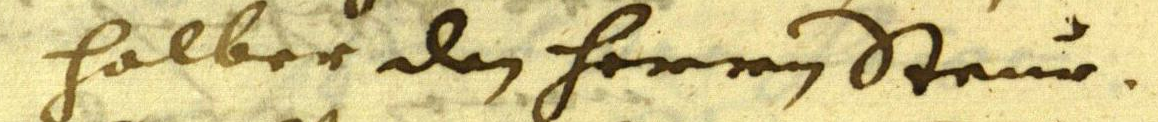halber den herrn Steūr.
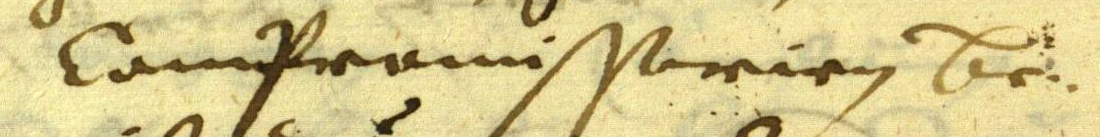ComPromissarien Be¬
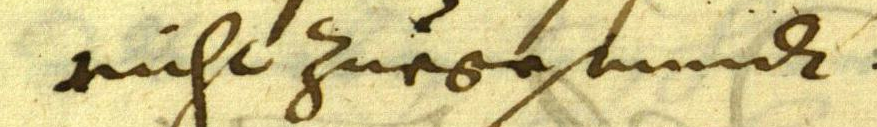richt Zūegesanndt.
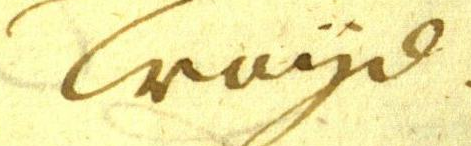Traÿd.
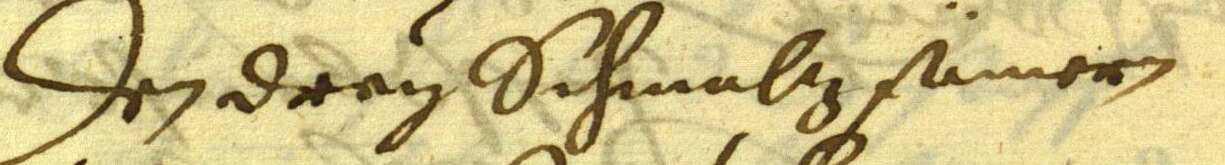Den dreȳ Schmalz sämern
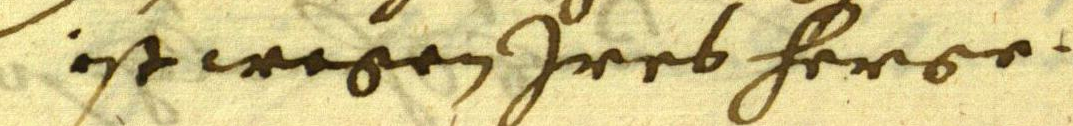ist wegen Ires herge¬
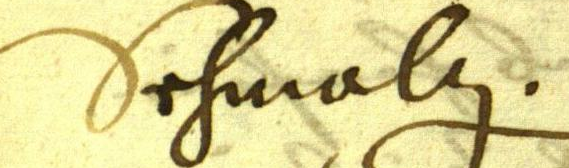Schmalz.
